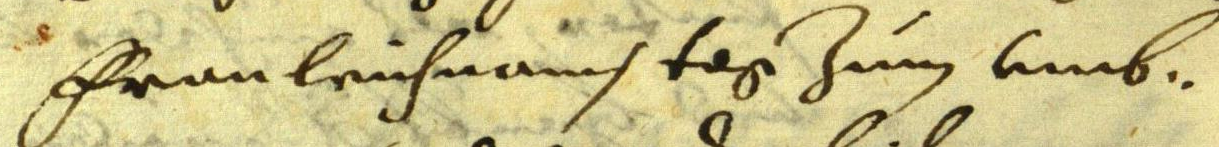Fronleichnamstag Zūm vmb¬
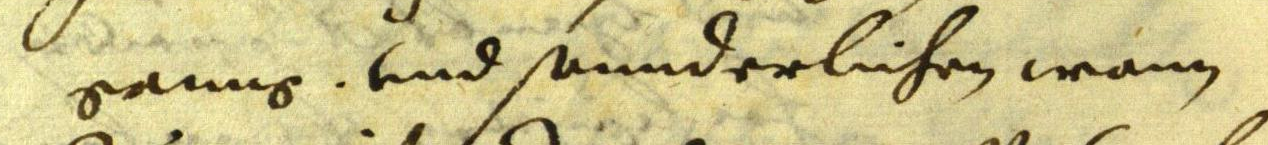ganng. vnd sonnderlichen wann
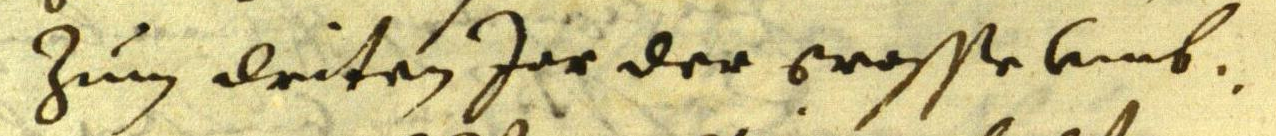Zūm driten Jar der grosse vmb¬
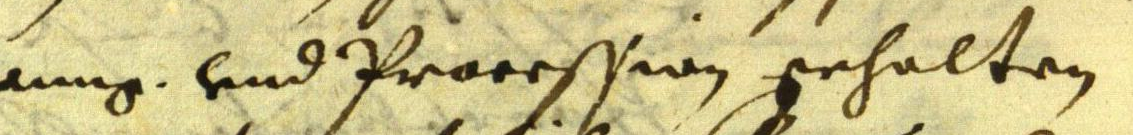ganng. vnd Procession gehalten
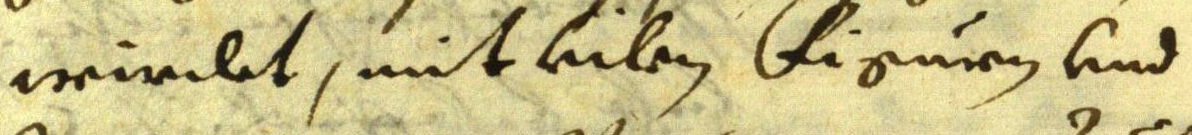wirdet, mit vilen Figūren vnd
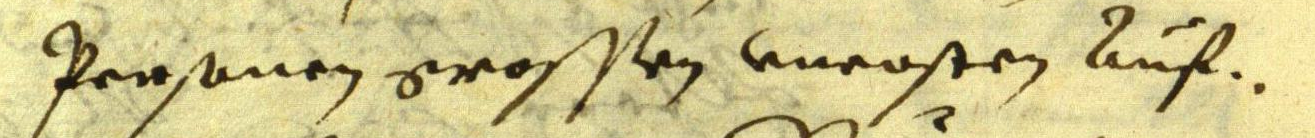Personen grossen vncosten Aūf¬
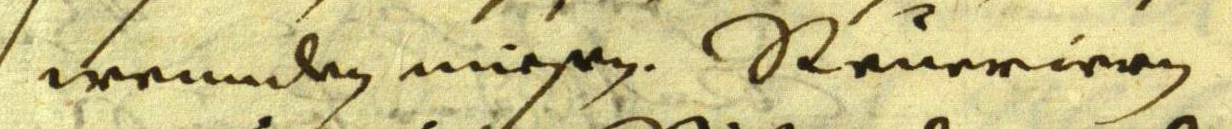wennden miesen. Rēūeriern
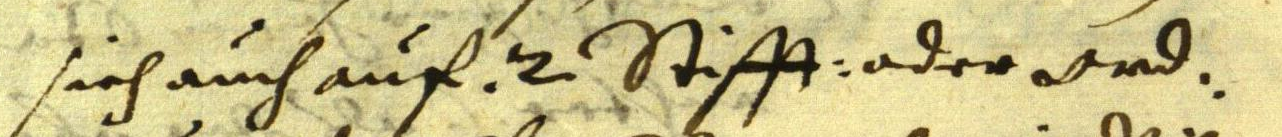sich aūch aūf. 2 Stifft: oder Ord¬
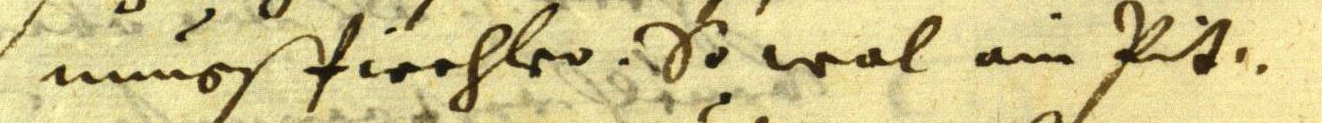nūngsPiechler. So wol ain Pit¬
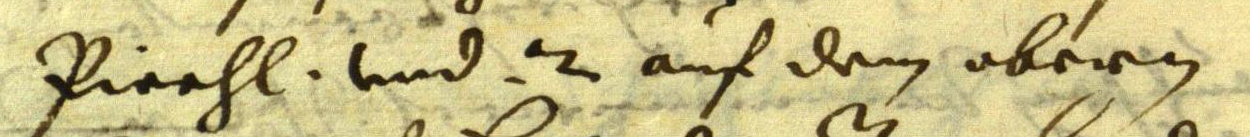Piechl. vnd. 2 aūf dem obern
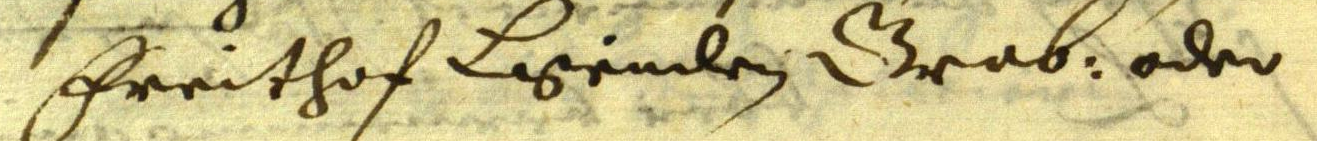Freithof Ligenden Grab: oder
